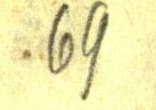69
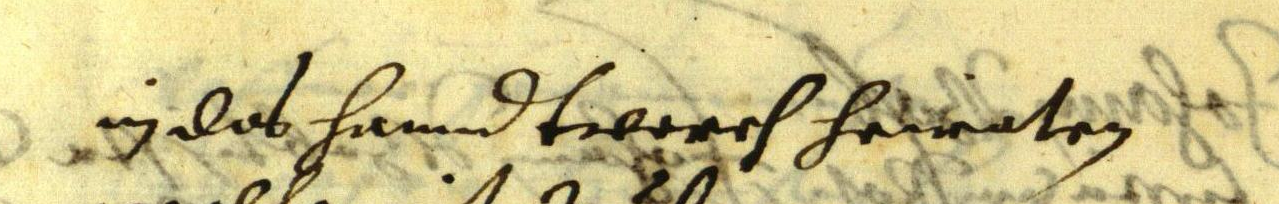in das hanndtwerch heiraten
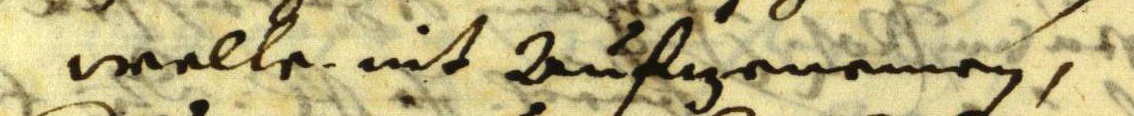welle. nit Aūfzenemen,
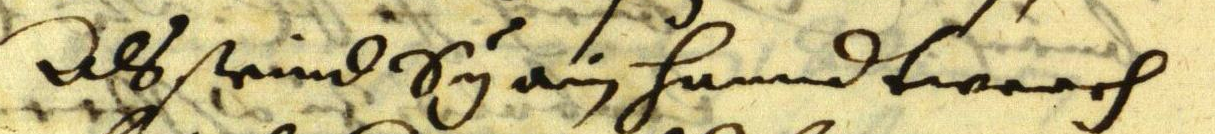Als seind Sȳ ain hanndtwerch
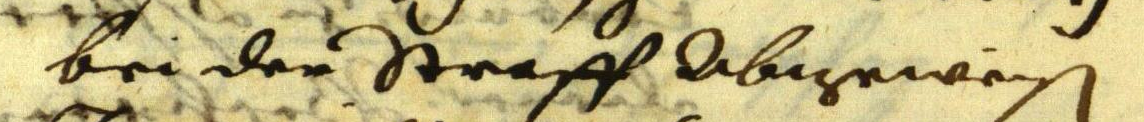bei der Straff Abzeweis
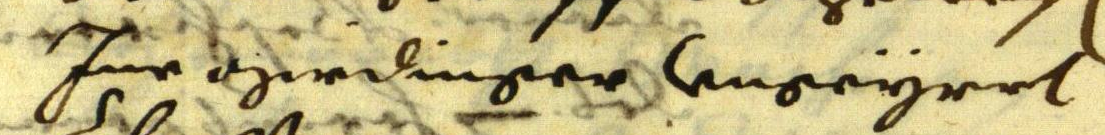Ime Mirdinger vngeÿret
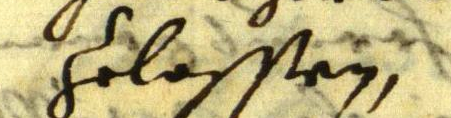Zelassen,
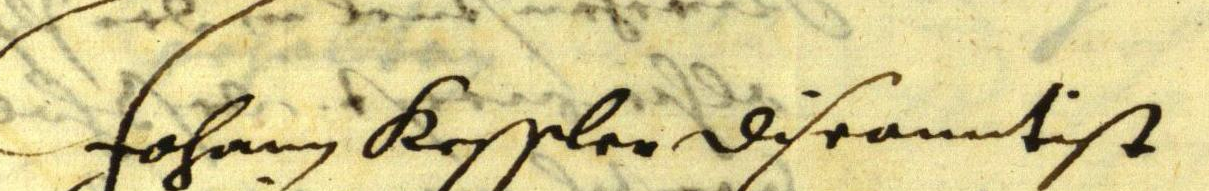Johann Kessler discanntist,
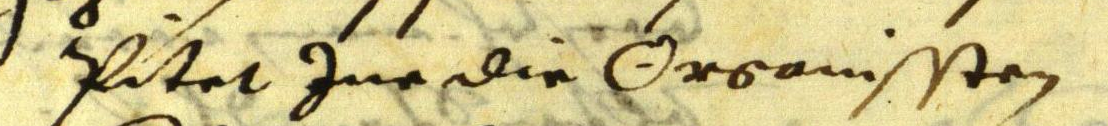Pitet Ine die Organissten
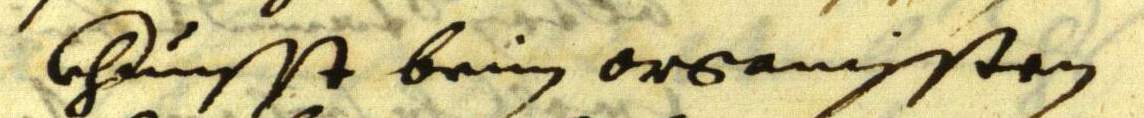Khūnsst beim organissten
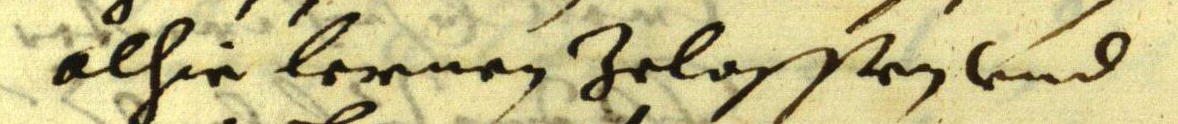alhie lernen Zelassen vnd
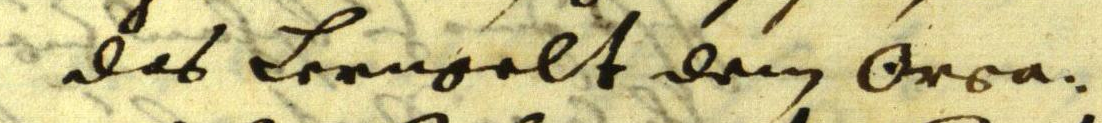das Lerngelt dem Orga¬
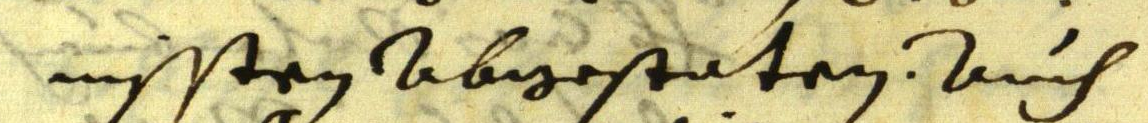nissten Abzestaten. Aūch
